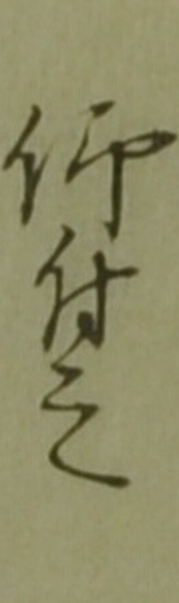仰付之
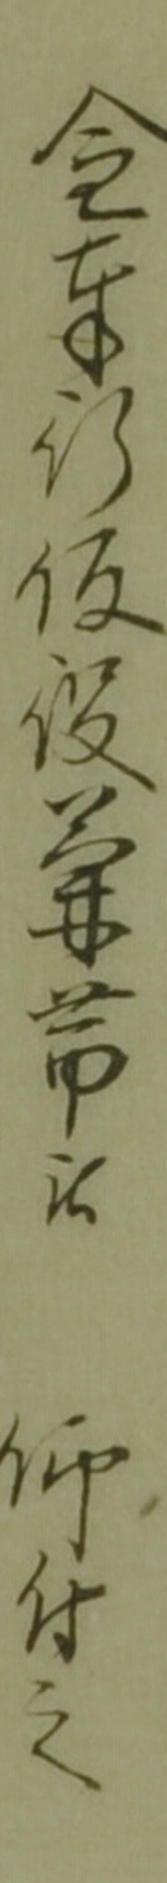金奉行仮役兼帯被仰付之
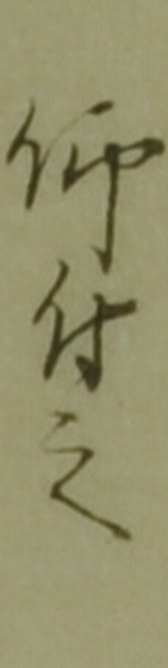仰付之
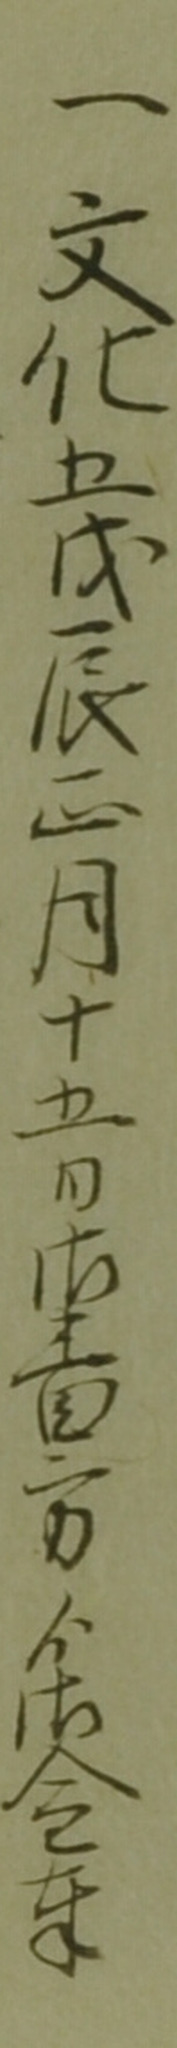一文化五戊辰正月十五日御番方ゟ御金奉
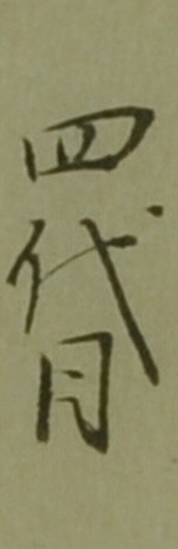四代目
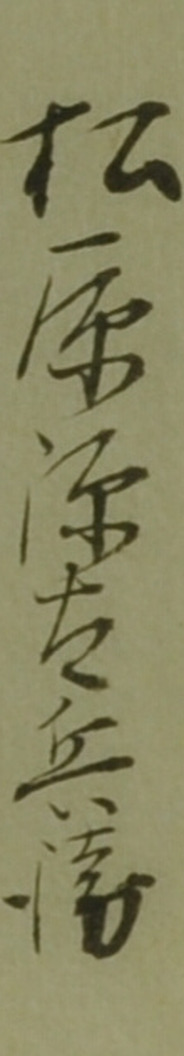松原源太兵衛
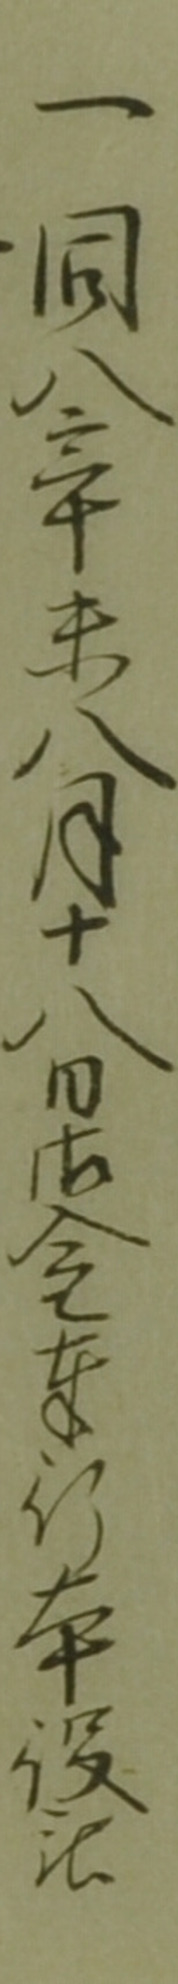一同八辛未八月十八日御金奉行本役被
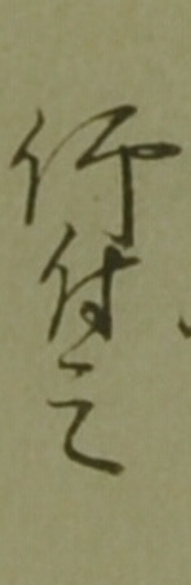仰付之
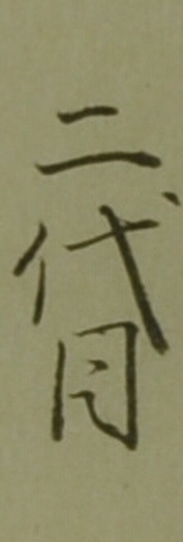二代目
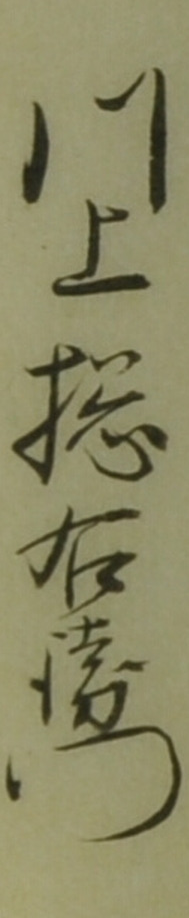川上総右衛門

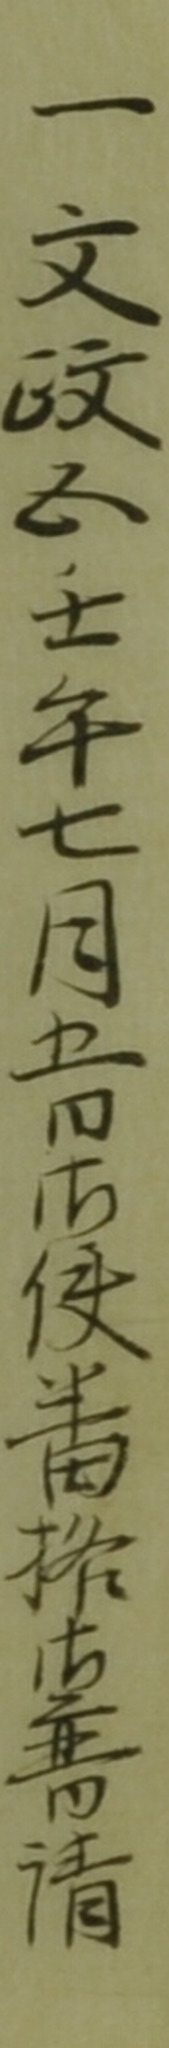一文政五壬午七月五日御使番格御普請
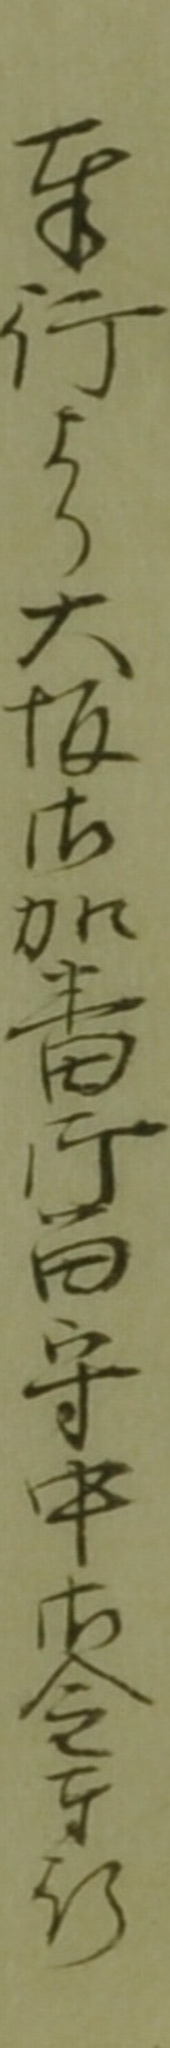奉行より大坂御加番御留守中御金奉行
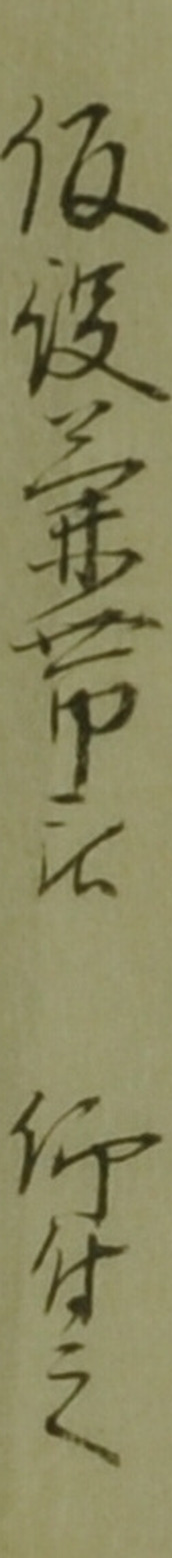仮役兼帯被仰付之
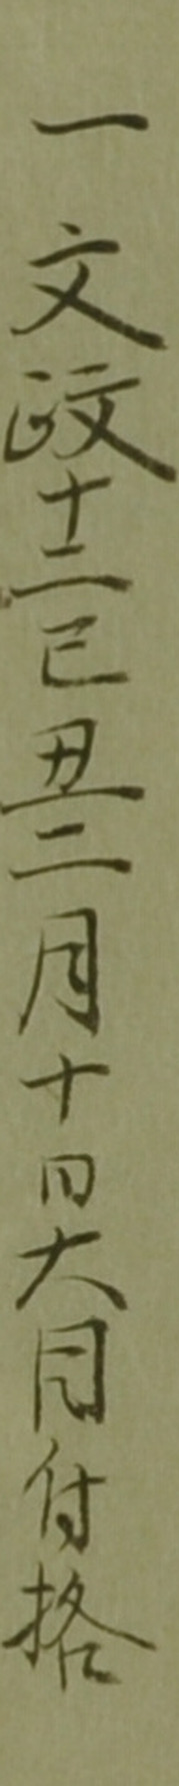一文政十二己丑二月十日大目付格
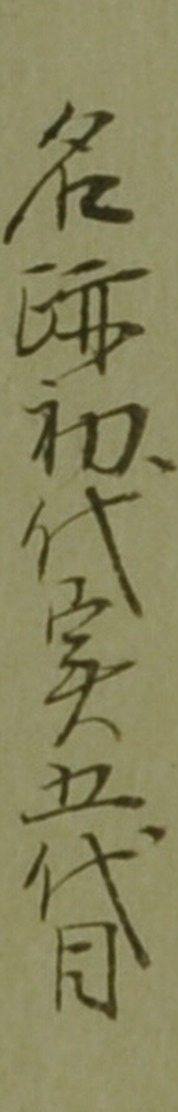名跡初代実五代目
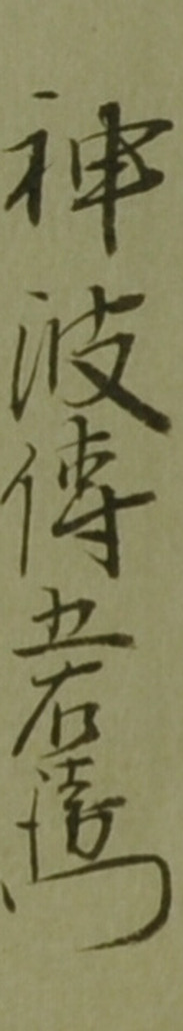神波伝五右衛門
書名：諸御役代々録（七）
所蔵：伊那市立高遠町図書館・合同会社AMANE
